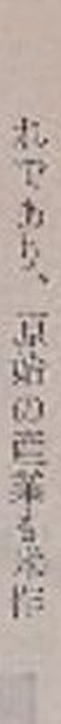れであり、原始の産業も米作
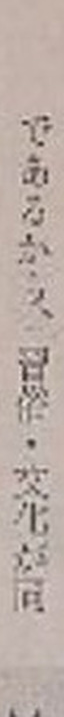であるから、習俗・文化が同
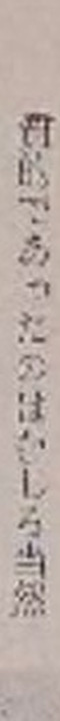質的であったのはむしろ当然
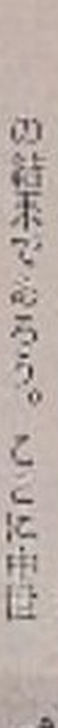の結果であろう。ことに中世
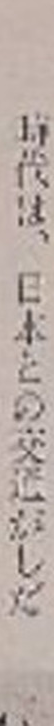時代は、日本との交通がしだ
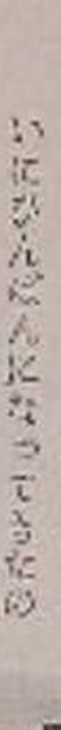いにひんぱんになってきたの
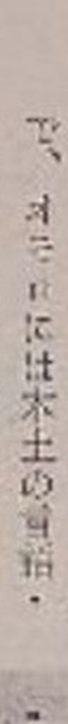で、オモロには本土の言語・
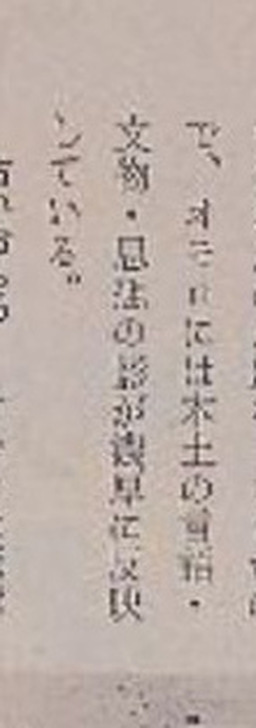文物・思想の影が濃厚に反映
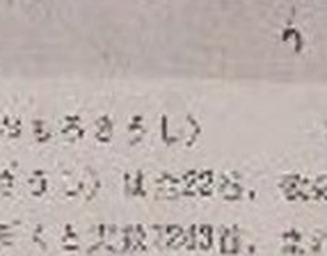本〈おもろさうし〉
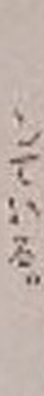している。
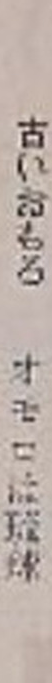古いおもろオモロは琉球
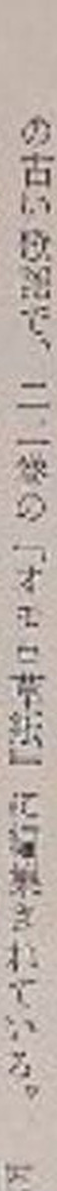の古い歌謡で、二一巻の『オモロ草紙』に編集されている。
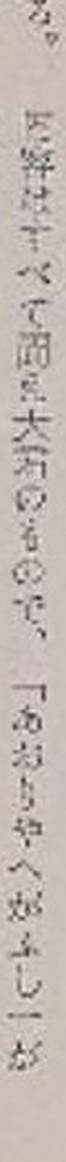内容はすべて聞え大君のもので、「あおりやへがふし」が
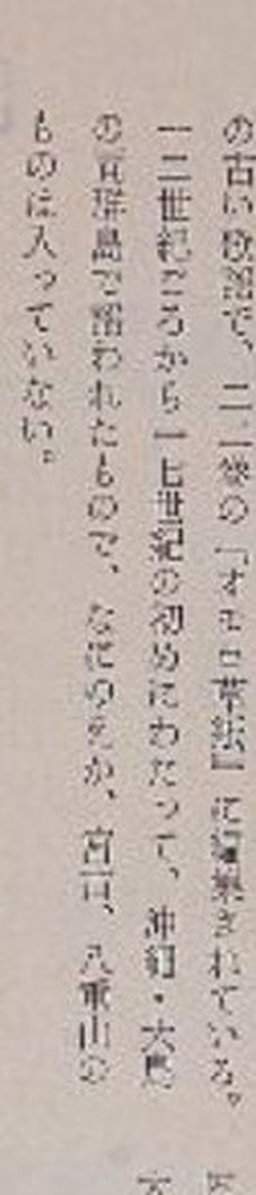の両群島で謡われたもので、なにゆえか、宮古、八重山の
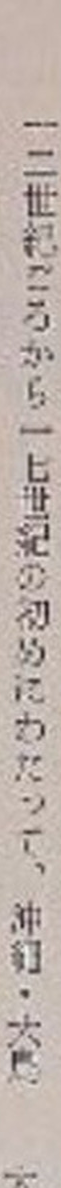一二世紀ごろから一七世紀の初めにわたって、沖縄・大島
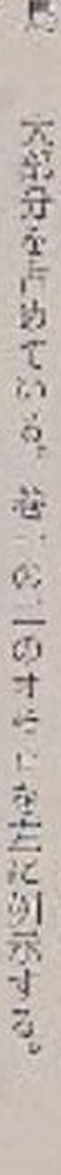大部分を占めている。巻一の二のオモロを左に例示する。
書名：沖縄口承文芸
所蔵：University of the Ryukyus Library
